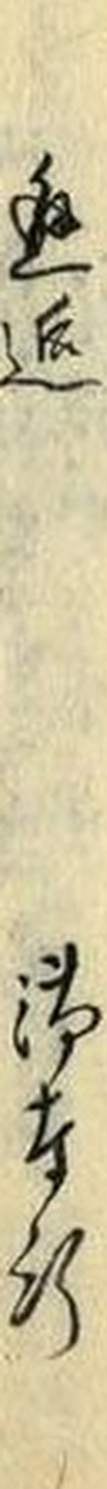逓逅御奉行
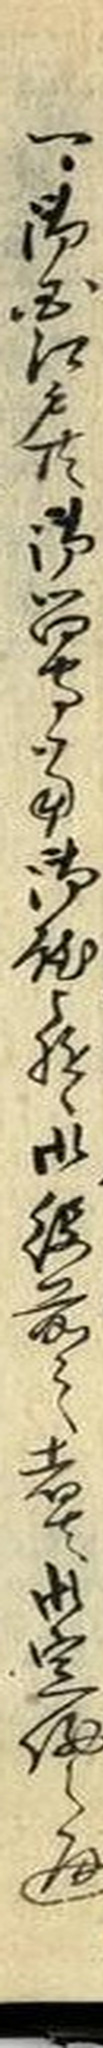一御国江戸共御留守御用御聴被遊候御役前之者は御定例之通
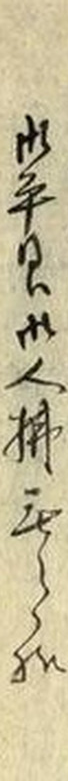御平日ハ御人払無之様
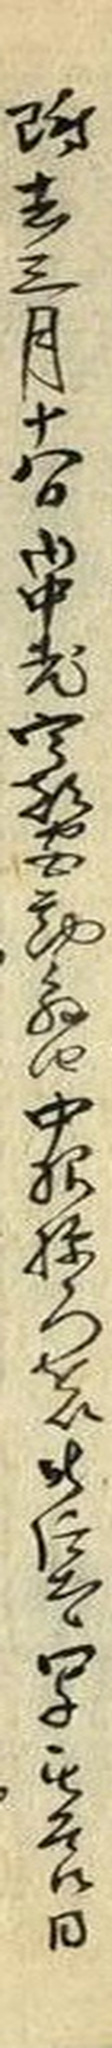附去三月十八日御中老宇都宮勘解由中根孫右衛門を以被仰出候写其節日
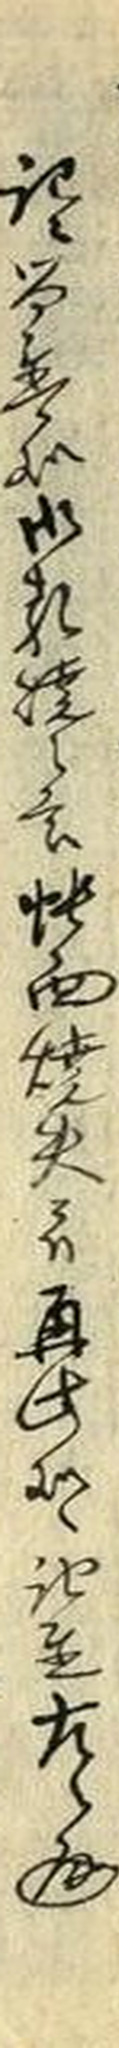記ニ留置候処御類焼之節帳面焼失ニ付再此処へ記置左之通
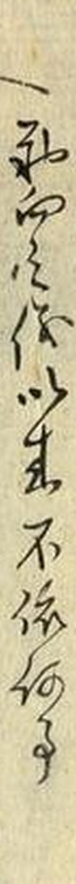勤向之儀以来不依何事
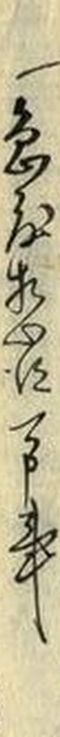急度相心得可申事
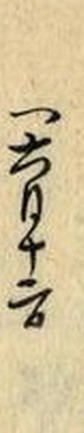一六月十五日
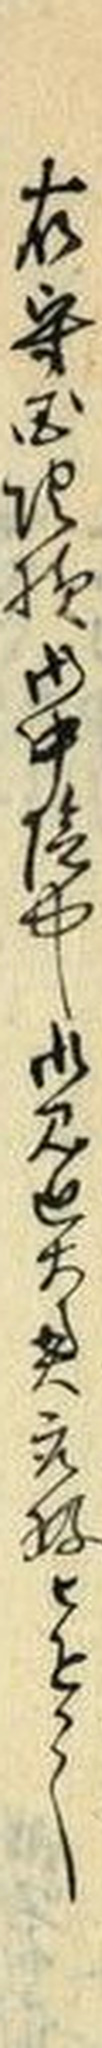右守国院様御中陰中御見廻大奥取扱被進之
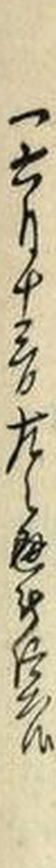一六月十三日左之通被仰出候
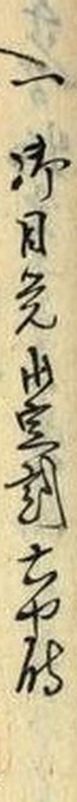一御目覚御定刻六半時
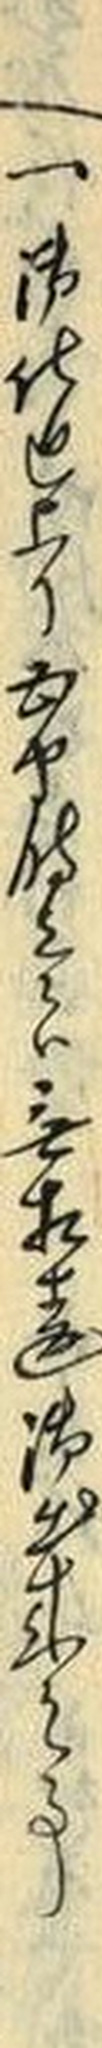一御仕廻上り五半時迄ニハ無相違御出来ニ候事
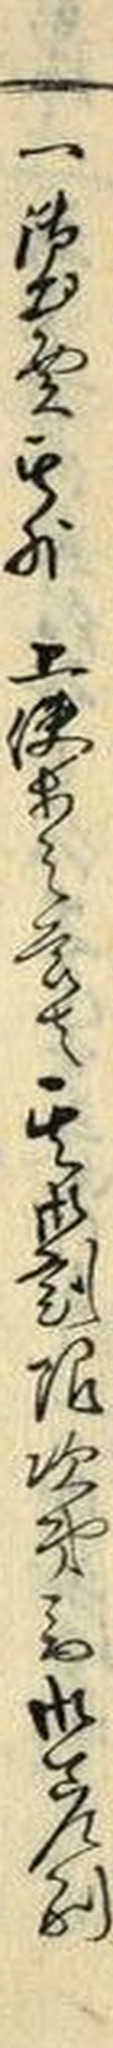一御出殿其外上使等之節は其御刻限次第ニ而御差別
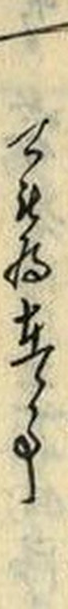可被為在候事
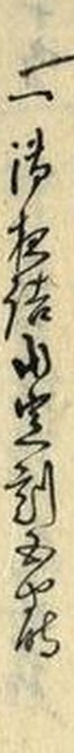一御夜詰御定刻五半時
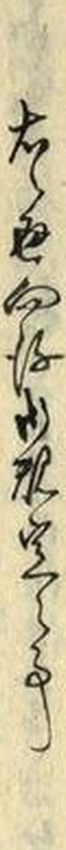右之通向後御規定之事
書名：少傅日録抄（斉承付側向頭取日記、在府）
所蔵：福井県文書館 Fukui Prefectural Archives
